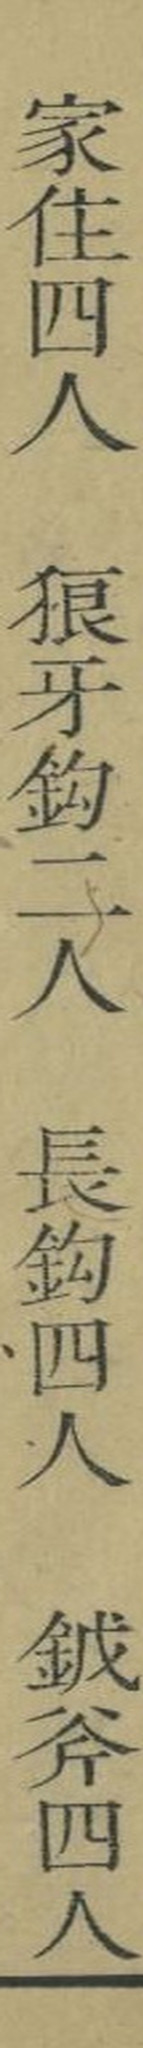家住四人狼牙鈎二人長鈎四人鉞斧四人
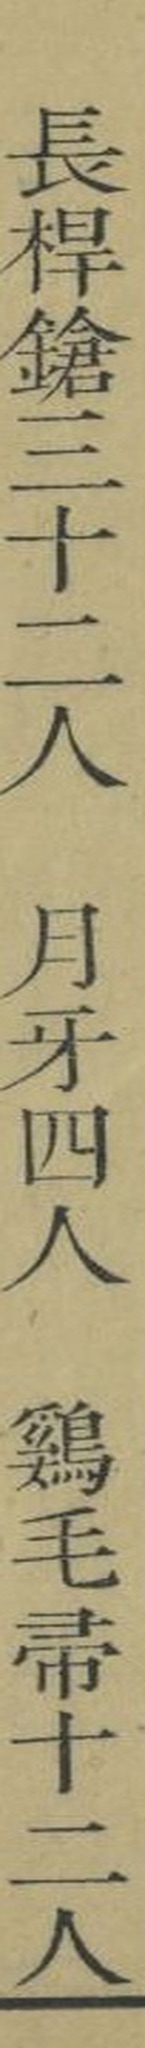長桿鎗三十二人月牙四人鷄毛帚十二人
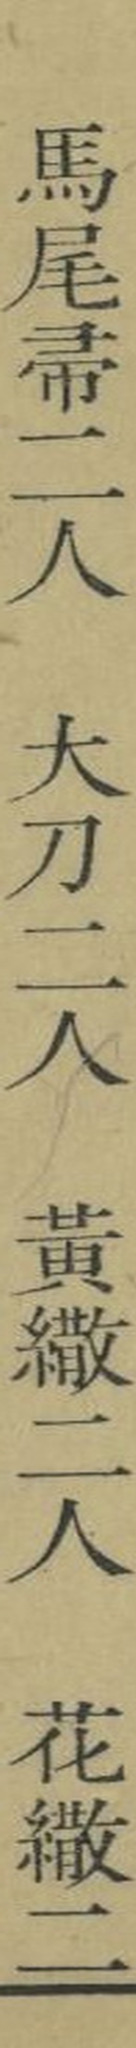馬尾帚二人大刀二人黃繖二人花繖二
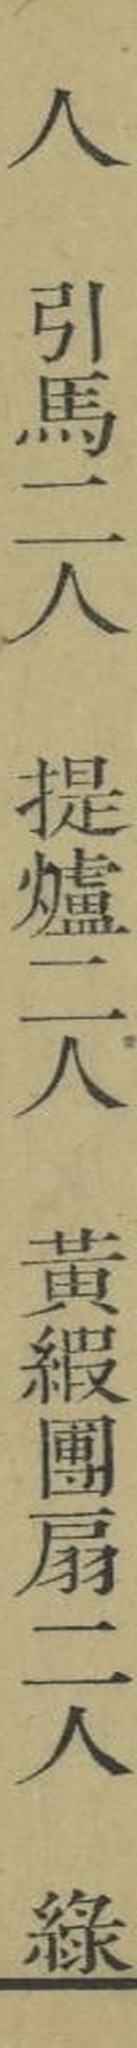人引馬二人提爐二人黃縀團扇二人綠
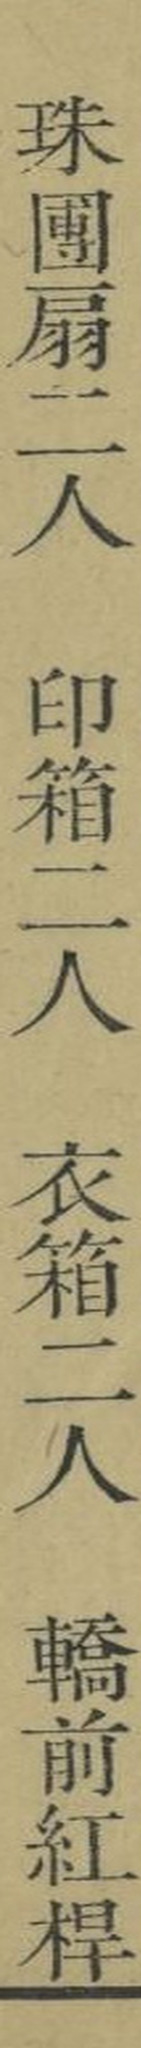珠團扇二人印箱二人衣箱二人轎前紅桿
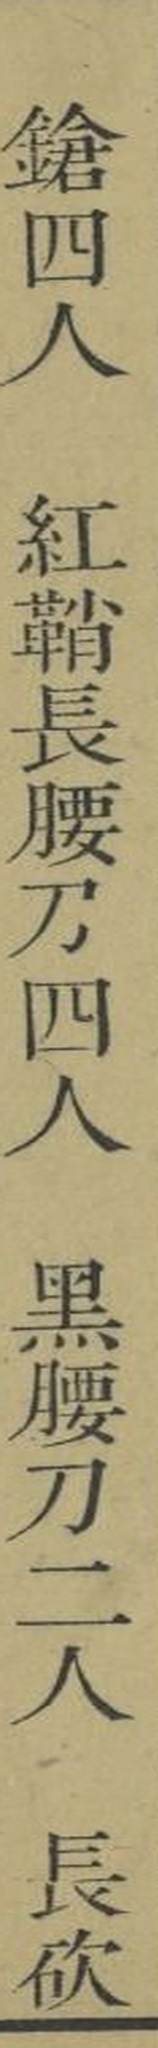鎗四人紅鞘長腰刀四人黑腰刀二人長砍
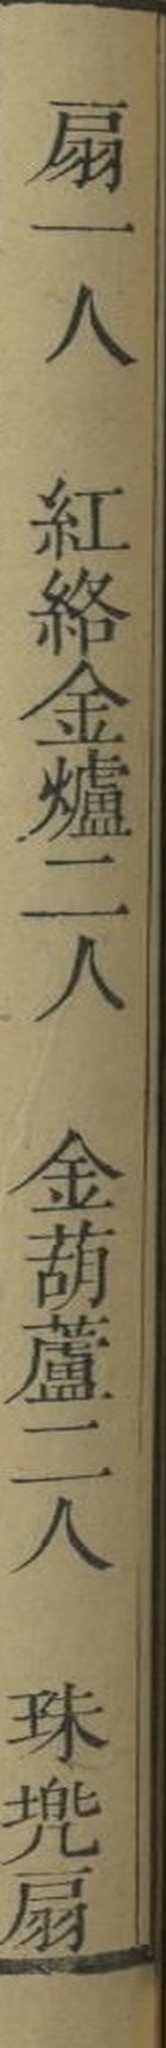扇一人紅絡金爐二人金葫蘆二人珠兠扇
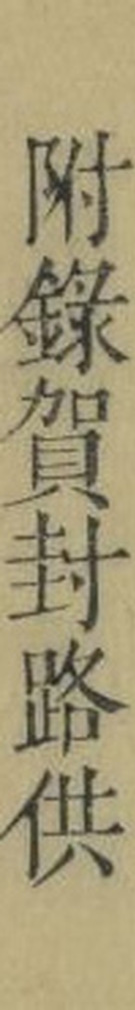附錄賀封路供
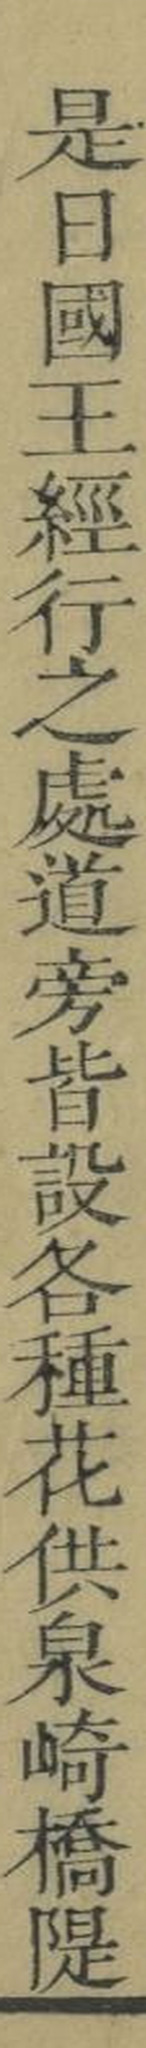是日國王經行之處道旁皆設各種花供泉崎橋隄
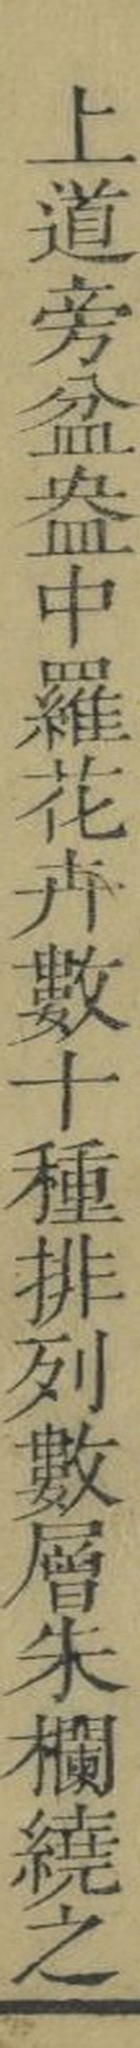上道旁盆盎中羅花卉數十種排列數層朱欄繞之
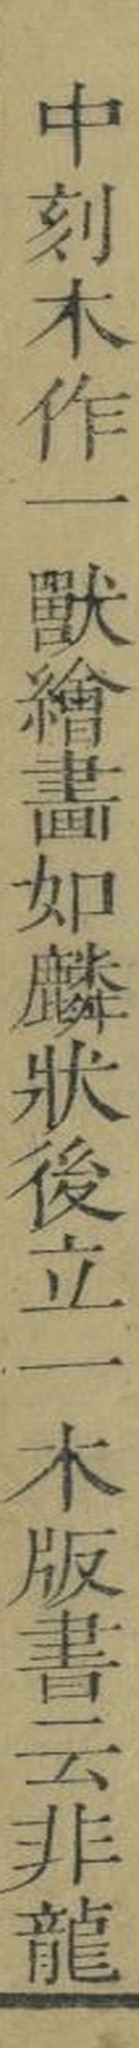中刻木作一獸繪畵如麟狀後立一木版書云非龍

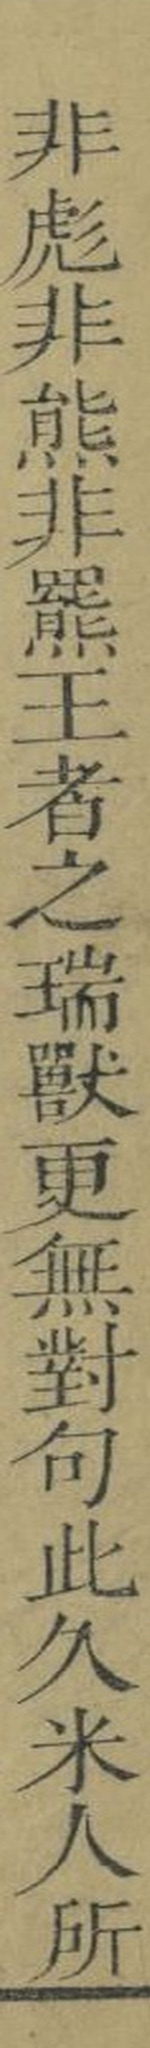非彪非熊非羆王者之瑞獸更無對句此久米人所
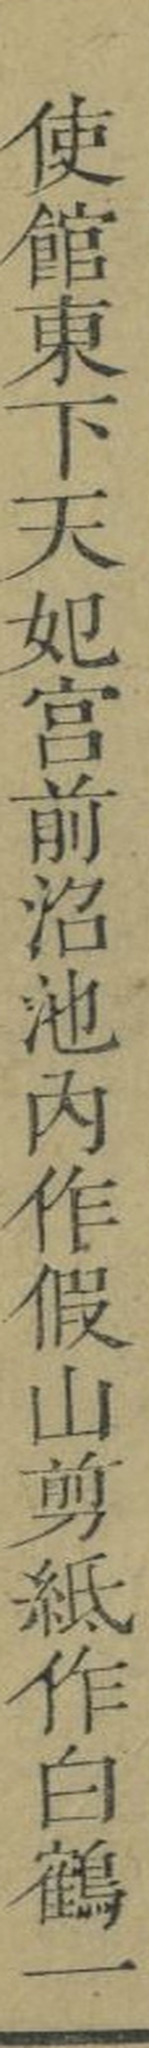使館東下天妃宫前沼池内作假山剪紙作白鶴一
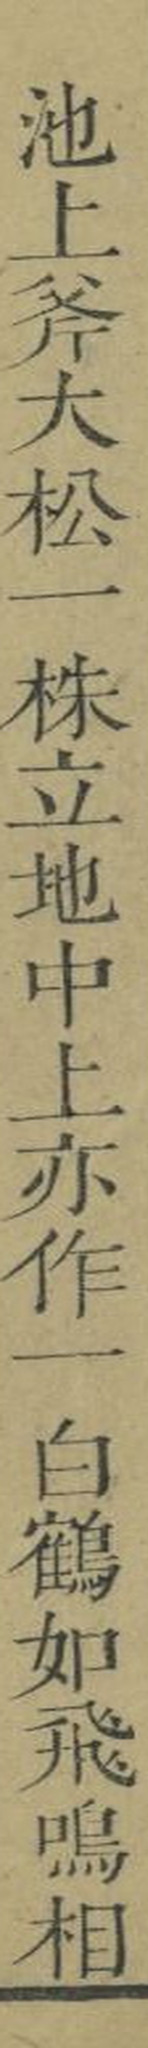池上斧大松一株立地中上亦作一白鶴如飛鳴相
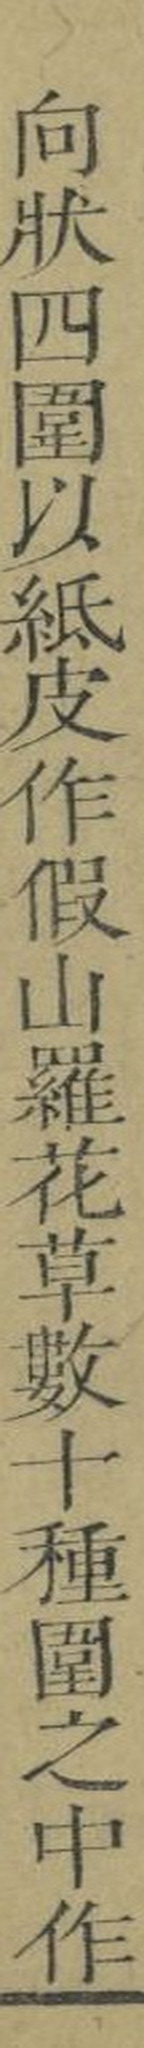向狀四圍以紙皮作假山羅花草數十種圍之中作
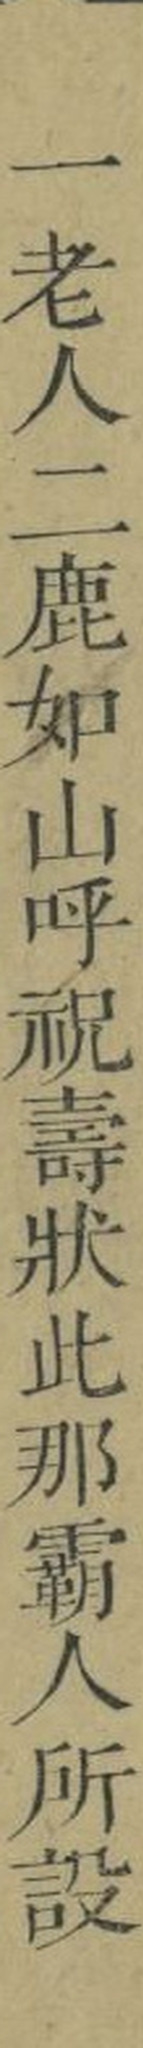一老人二鹿如山呼祝壽狀此那霸人所設
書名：中山伝信録 巻二
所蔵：University of the Ryukyus Library
